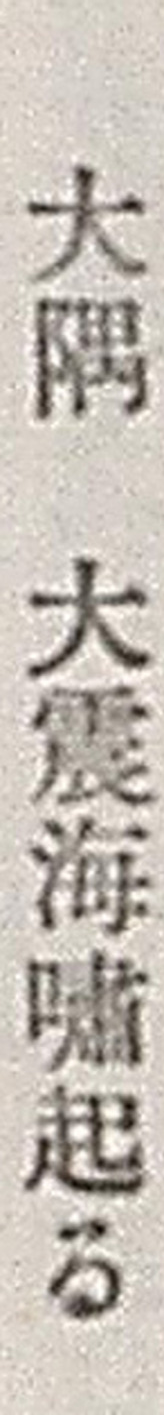大隅大震海嘯起る
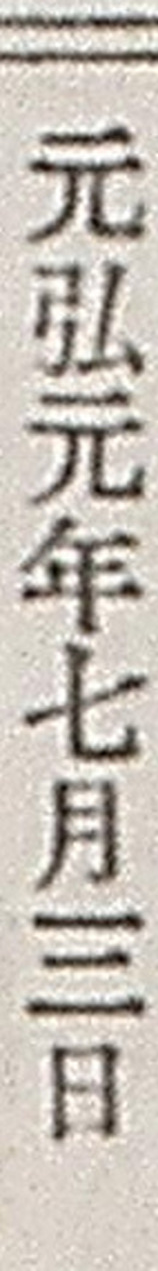元弘元年七月三日
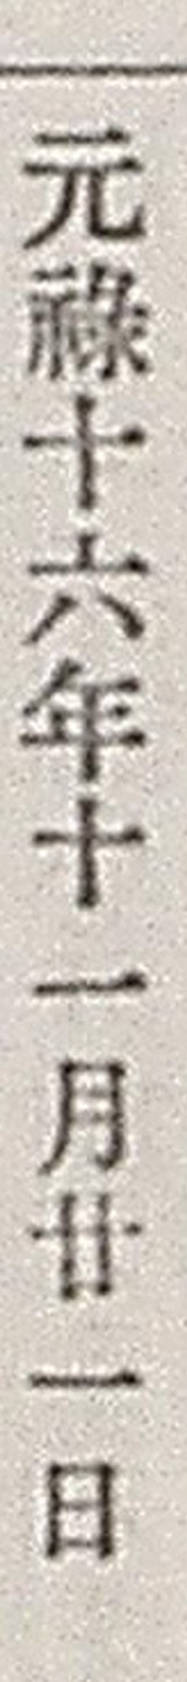元禄十六年十一月廿一日
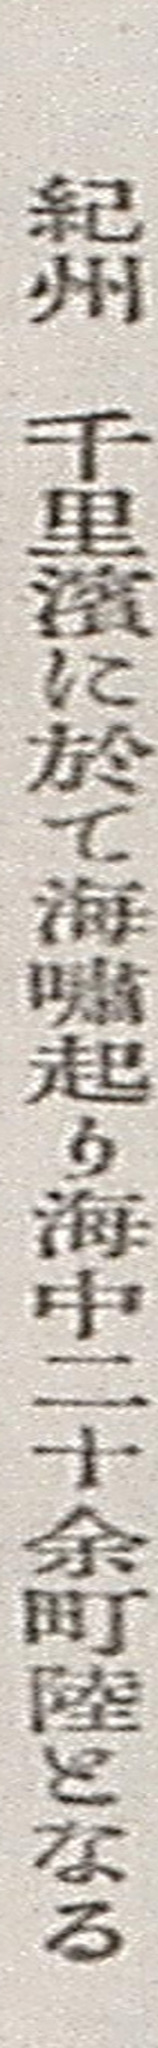紀州千里浜に於て海嘯起り海中二十余町陸となる
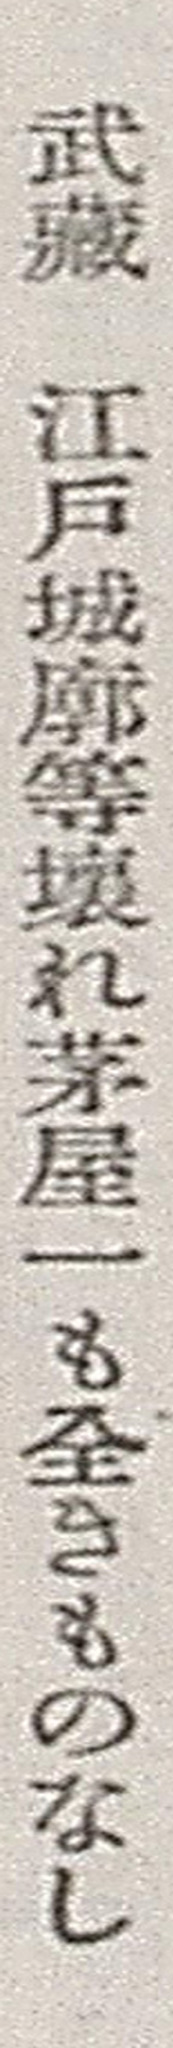武蔵江戸城郭等壊れ茅屋一も全きものなし
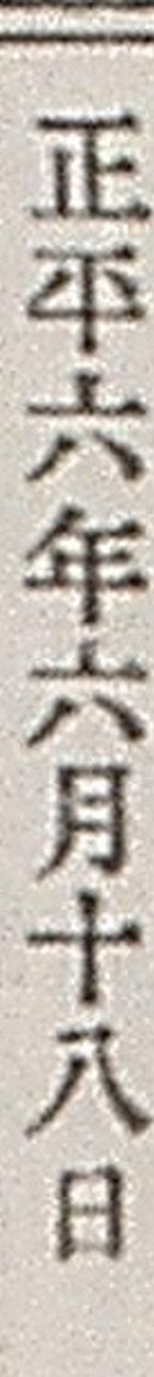正平六年六月十八日
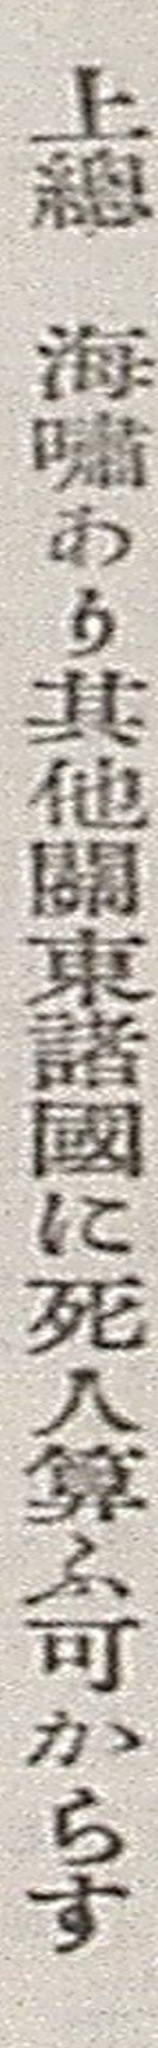上総海嘯あり其他関東諸国に死人算ふ可からす
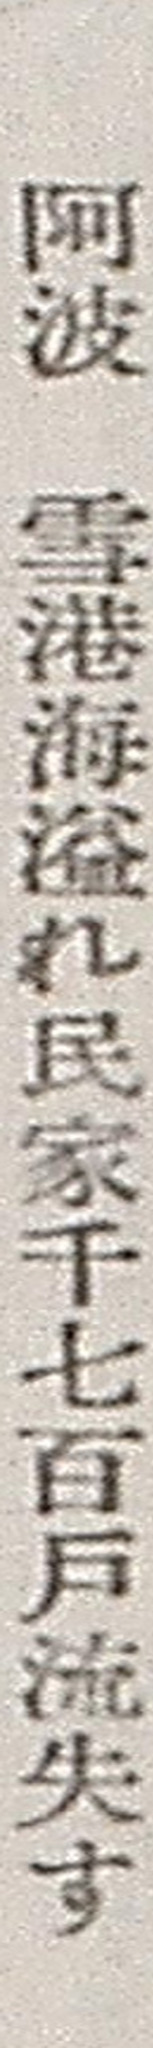阿波雪港海溢れ民家千七百戸流失す
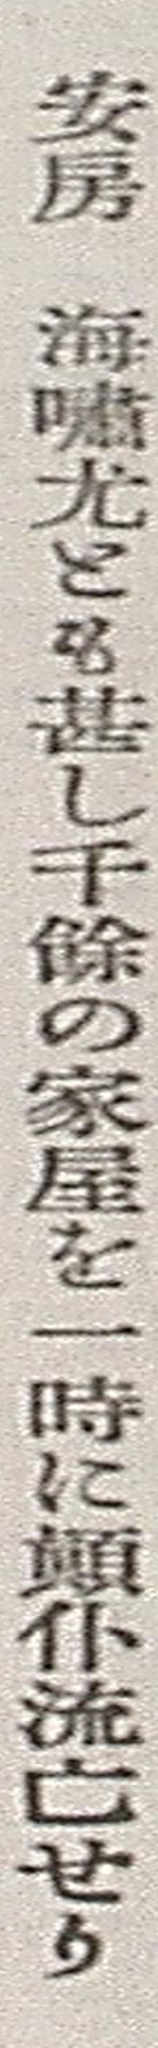安房海嘯尤とも甚し千余の家屋を一時に顛仆流亡せり
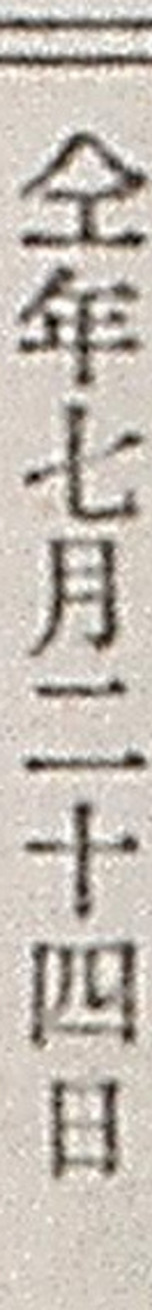仝年七月二十四日
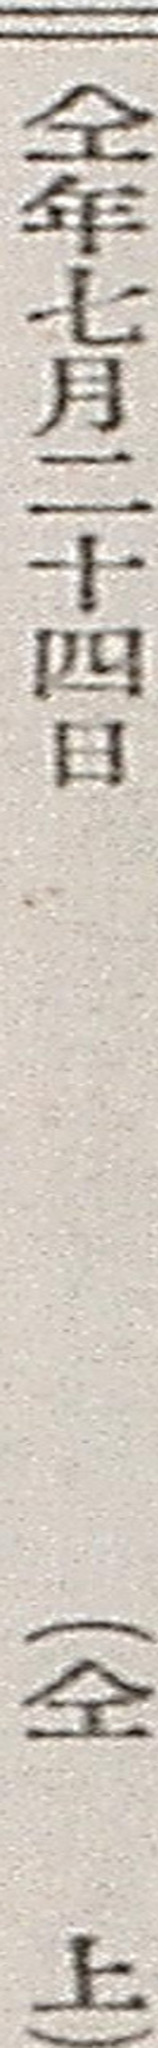仝年七月二十四日
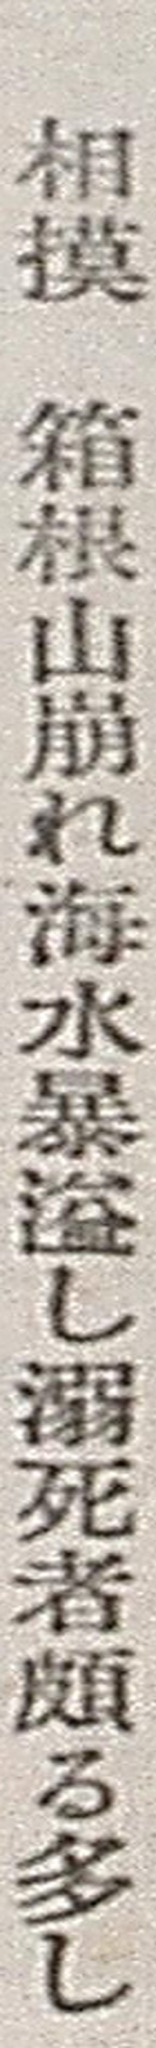相模箱根山崩れ海水暴溢し溺死者頗る多し
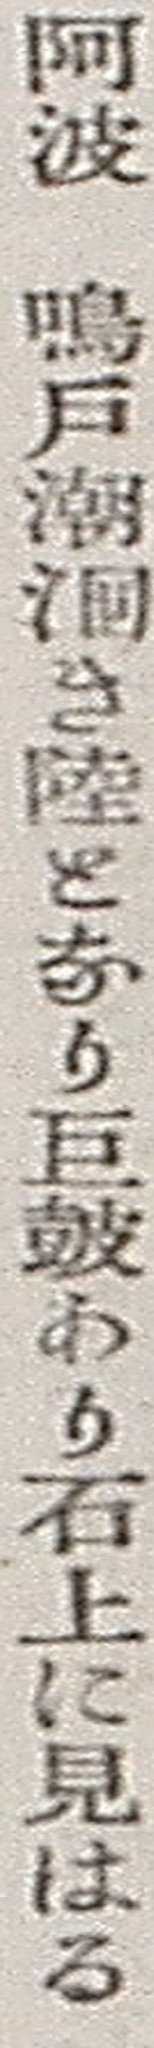阿波鳴戸潮洄き陸となり巨皷あり石上に見はる
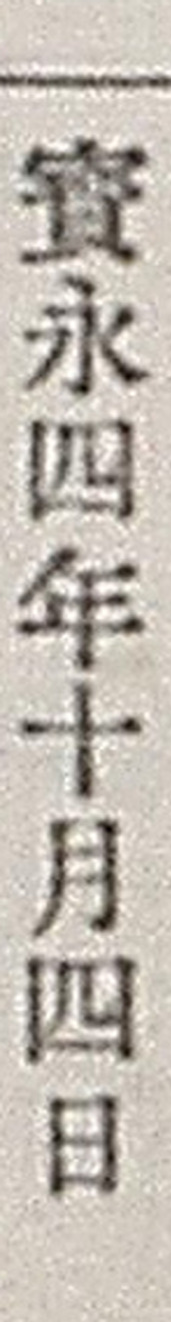寛永四年十月四日
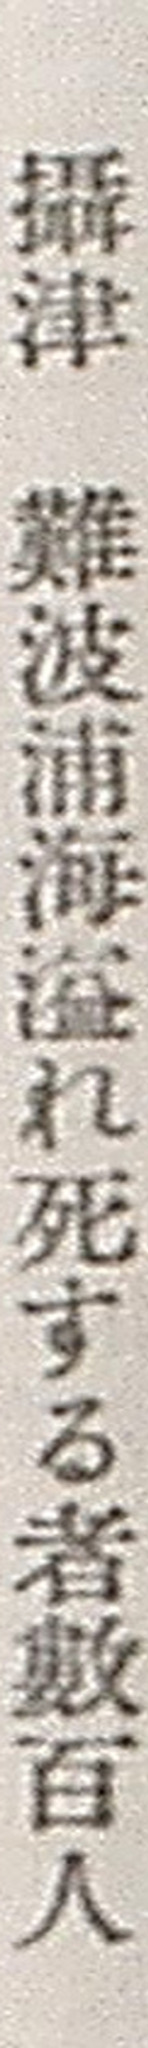摂津難波浦海溢れ死する者数百人
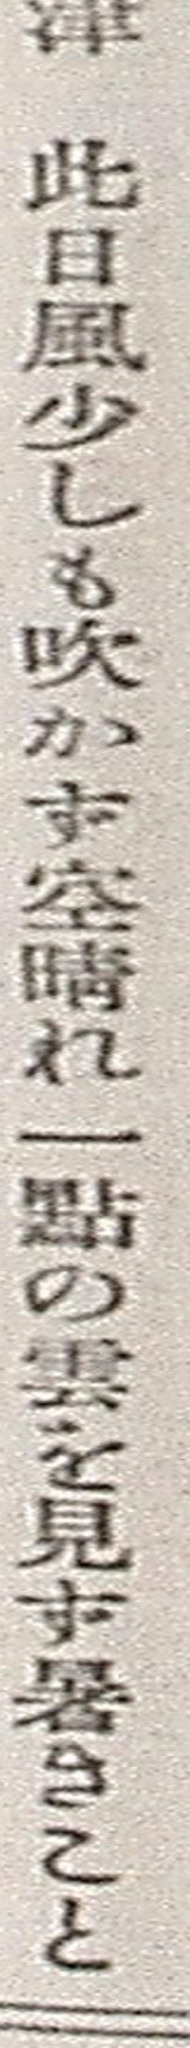摂津此日風少しも吹かず空晴れ一点の雲を見ず暑きこと
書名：風俗畫報臨時増刊第百二十號　大海嘯被害録（下）
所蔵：東京大学地震研究所図書室 Earthquake Research Institute Library, The University of Tokyo, JAPAN
